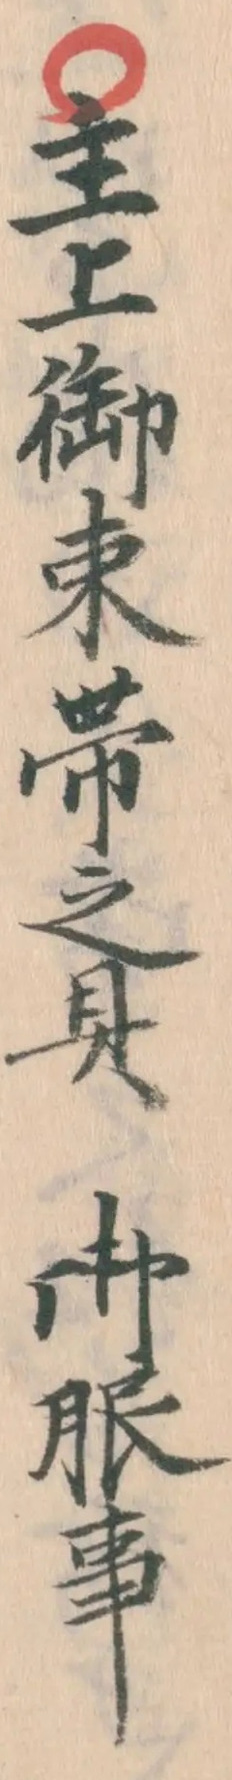○主上御束帯之具御服事
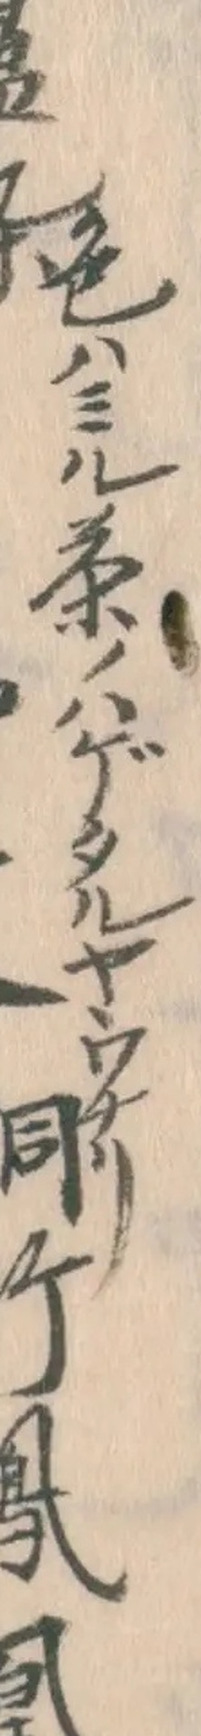色ハミル茶ノハゲタルヤウナリ

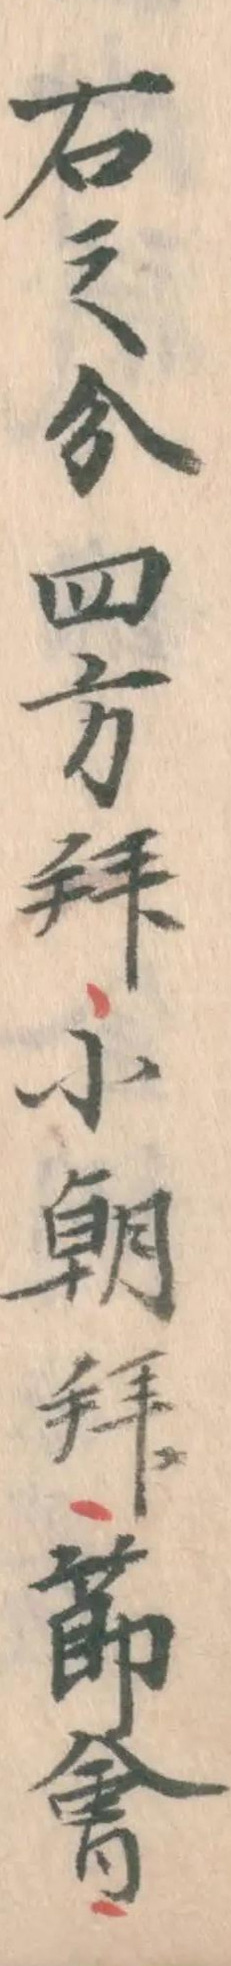右之分四方拝・小朝拝・節会・
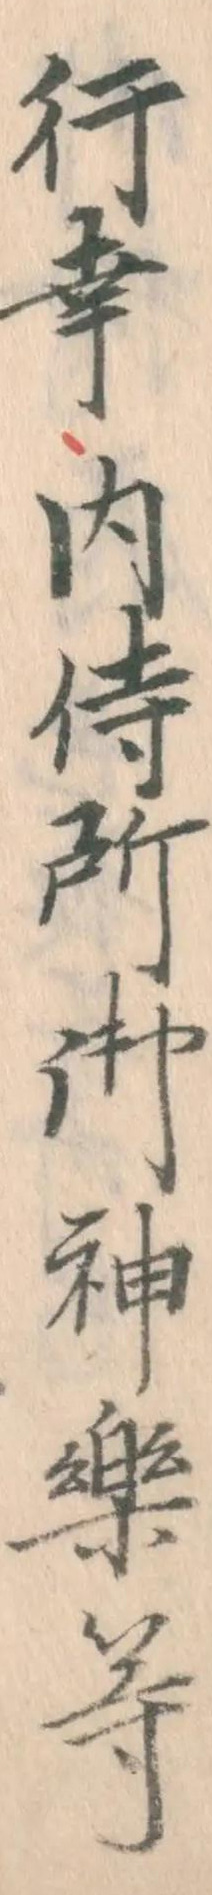行幸・内侍所御神楽等
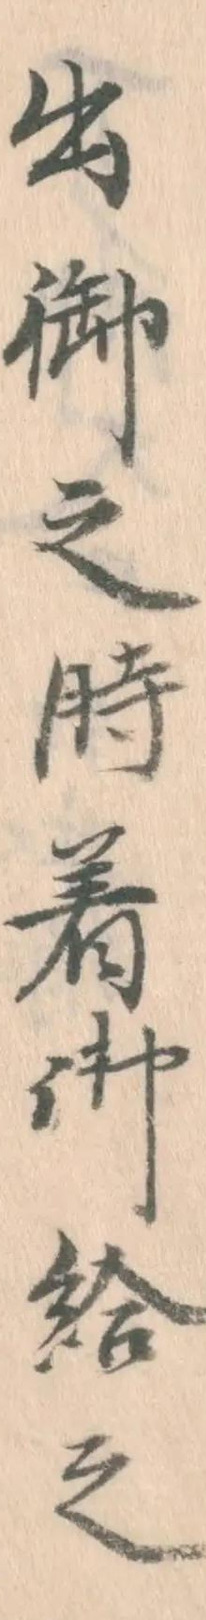出御之時着御給之
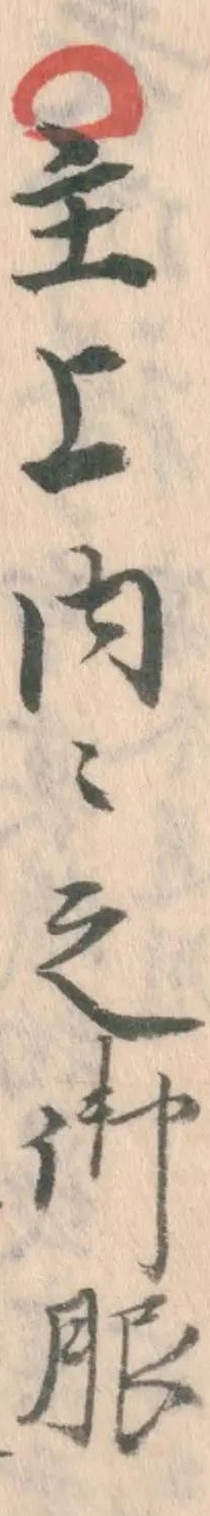○主上内々之御服
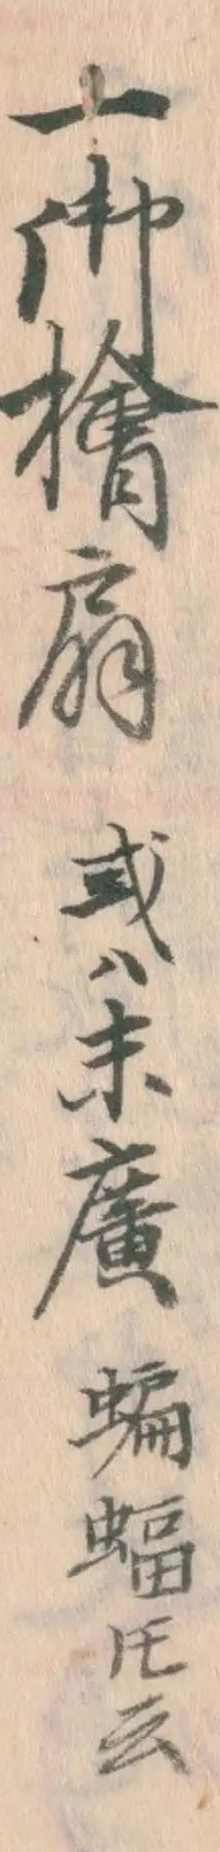一御桧扇或ハ末広蝙蝠トモ云
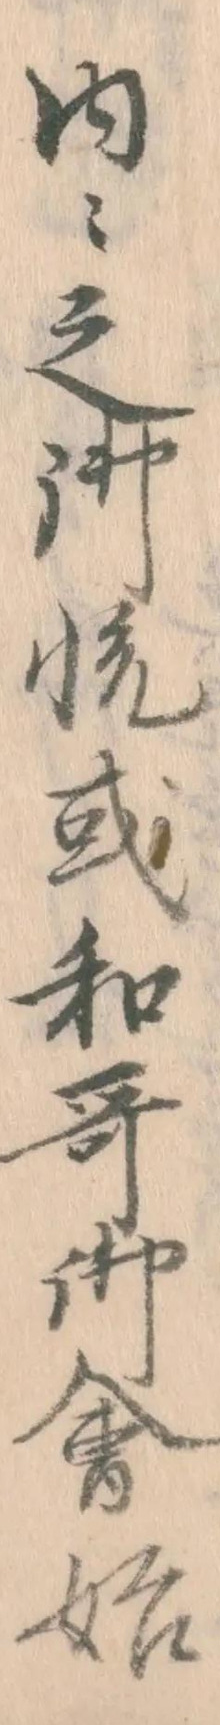内々之御悦或和歌御会始
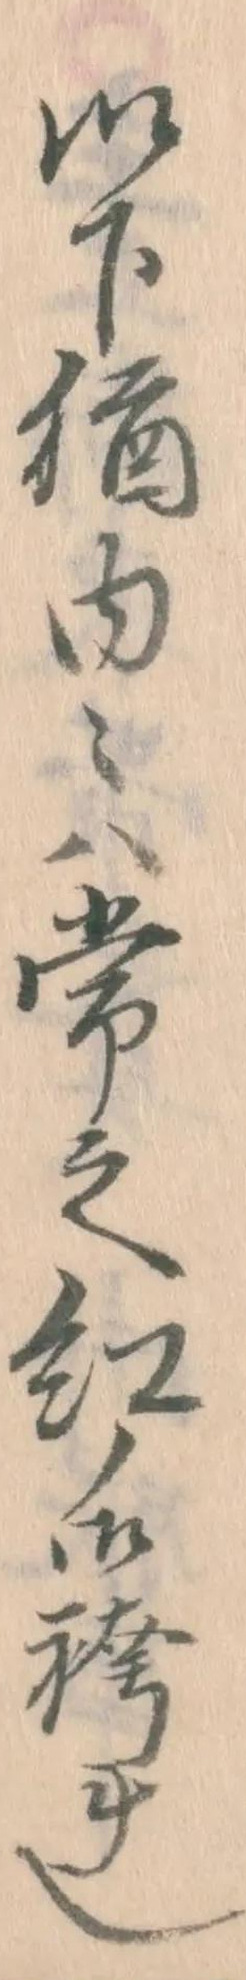以下猶内々ハ常之紅ノ御袴斗也
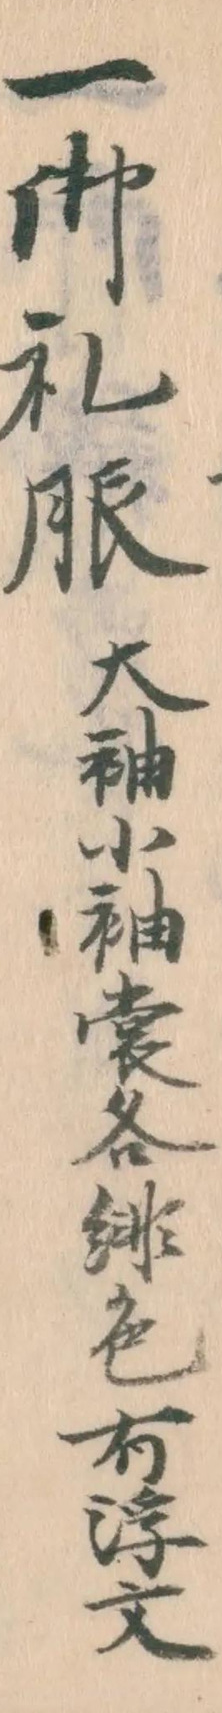一御礼服大袖小袖裳各緋色有浮文
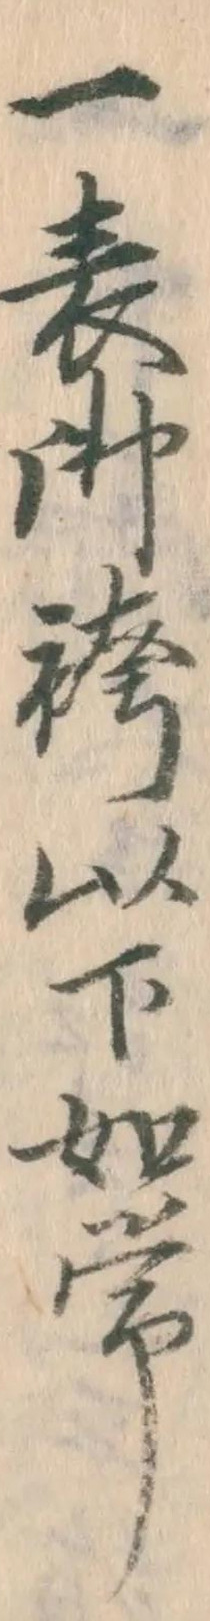一表御袴以下如常
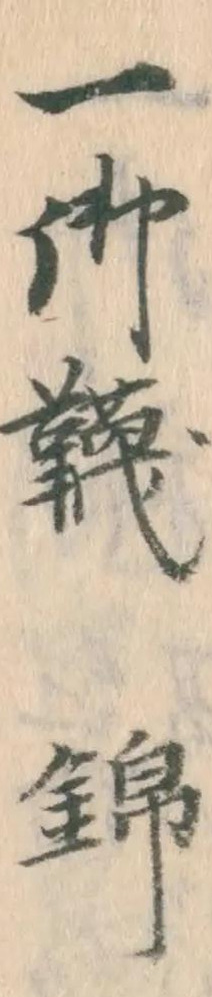一御韈錦
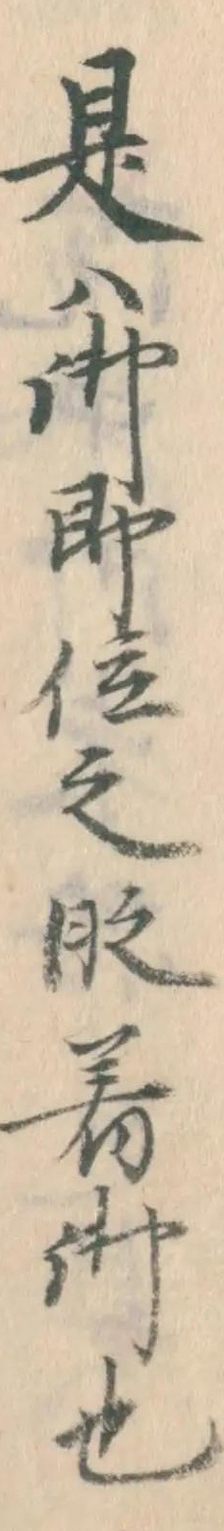是は御即位之着御也

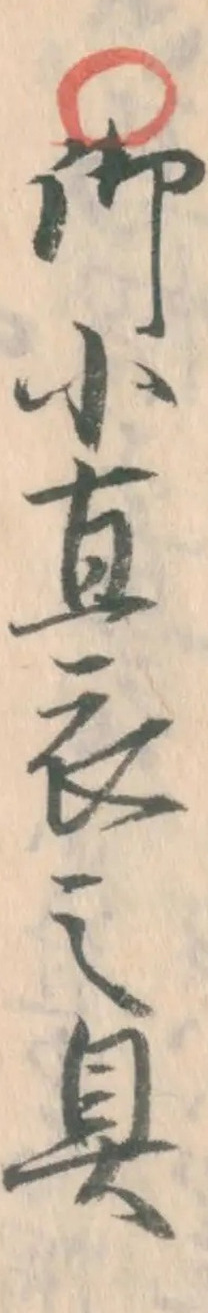○御小直衣之具
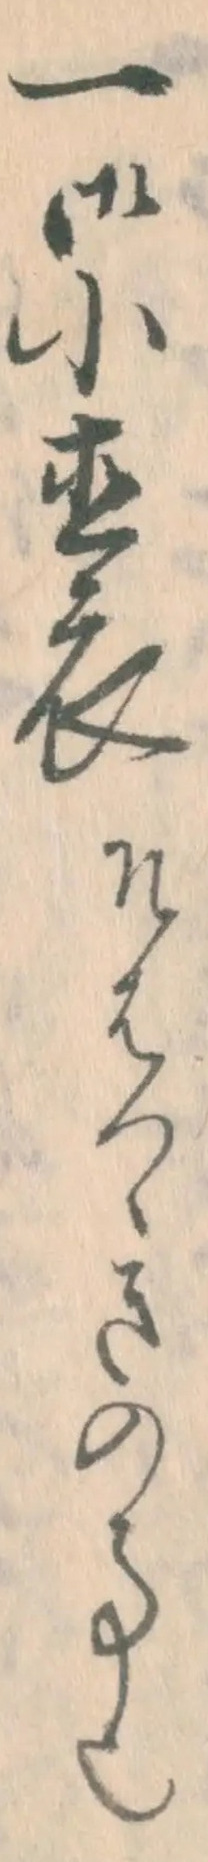一御小直衣そはつゝきの事也
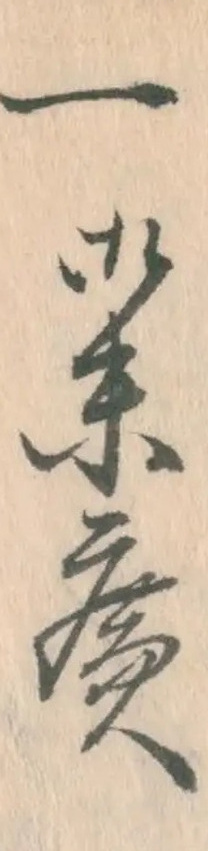一御末広
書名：賀茂社記録. 第80冊
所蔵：国立国会図書館 National Diet Library, JAPAN
